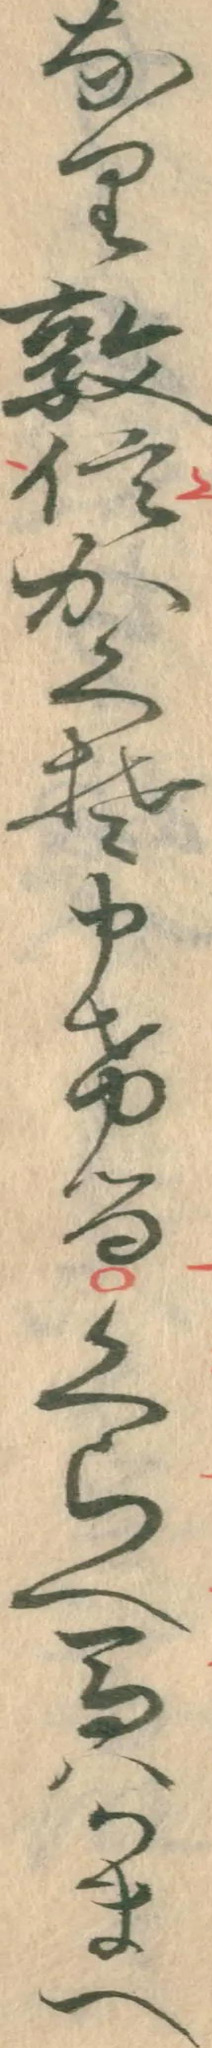なり敦信かくそ申ける◦くらへ馬はかまへ
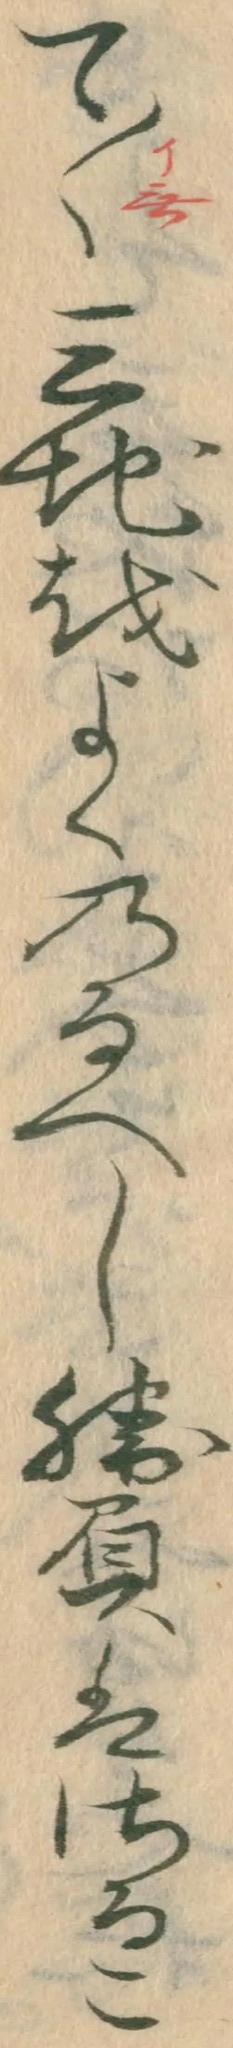て〳〵三地をよくのるへし膝負はさるこ

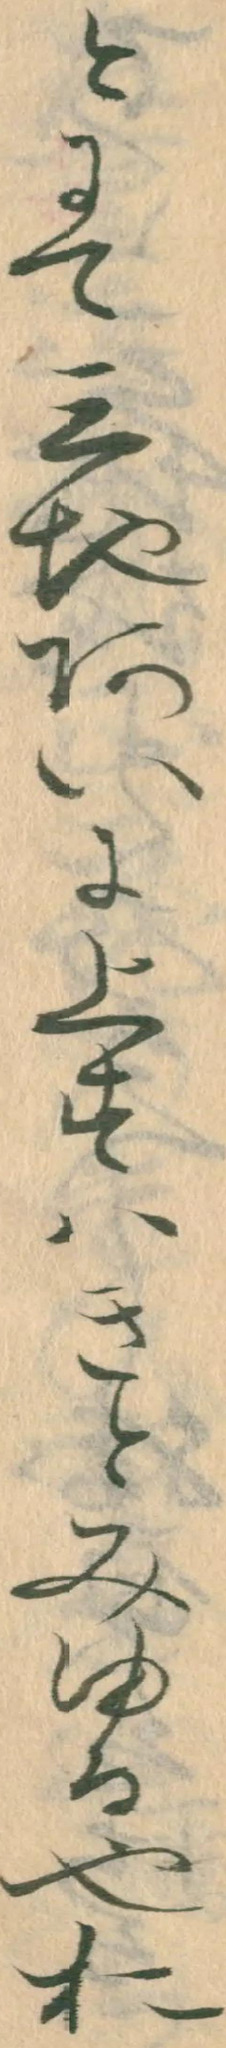とにて三地あいに上すはきとみゆる也お
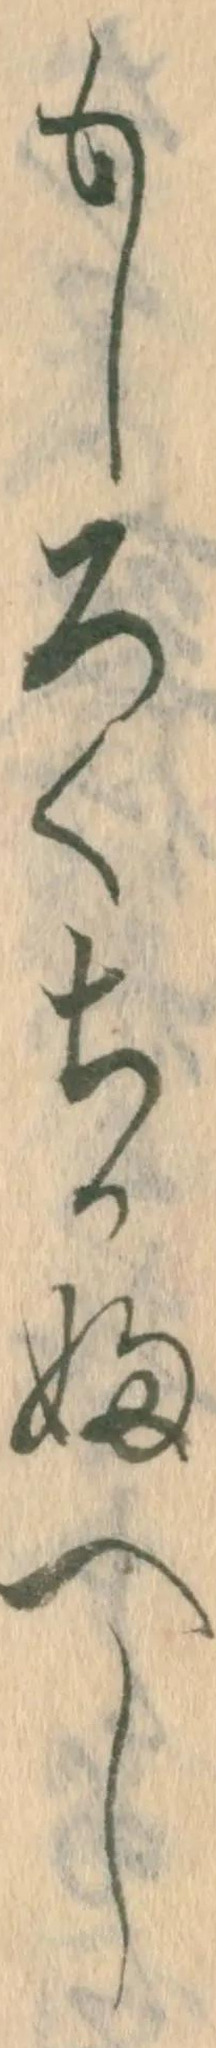もしろくちかふへし
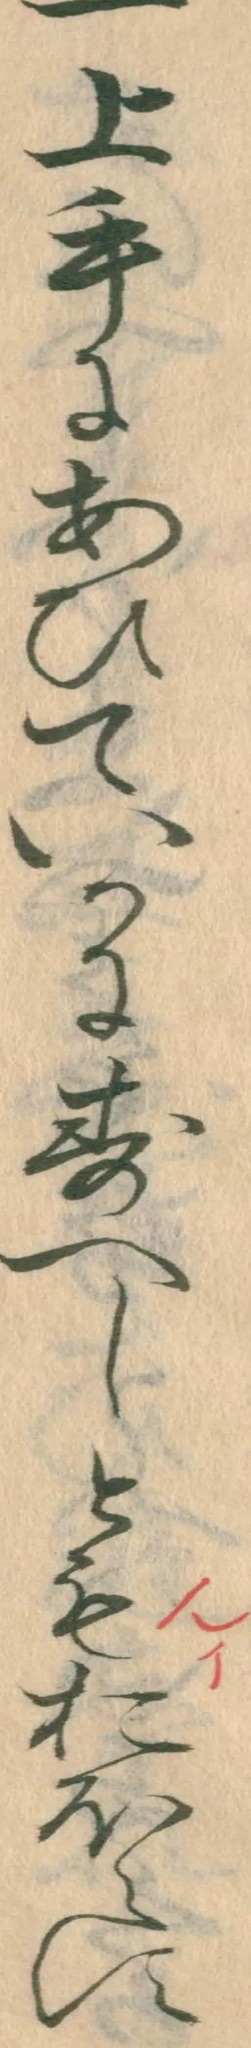一上手にあひていかにすへしともおほえす
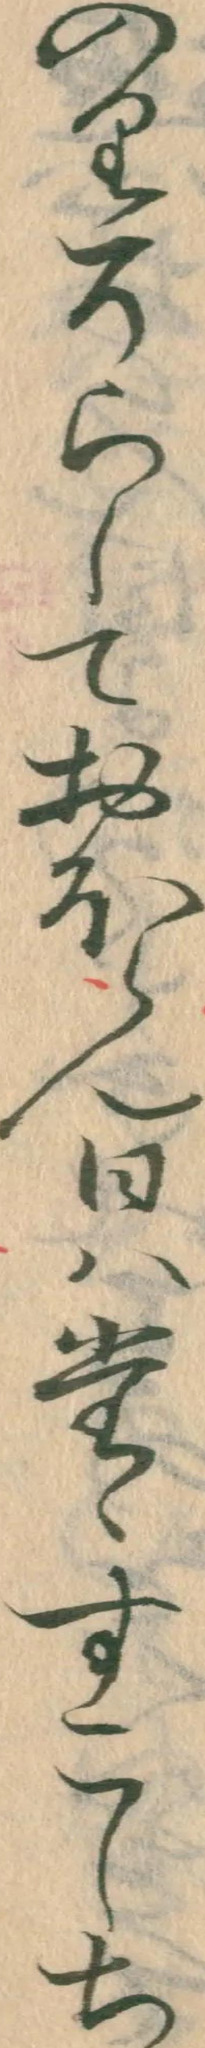のりそらしておほらん日はたゝすこしち
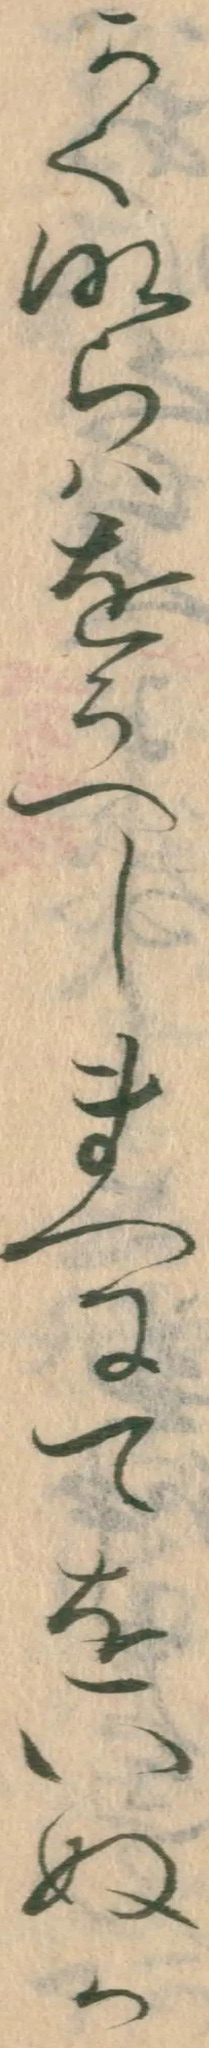かくならはをうへしまつにてをいぬか
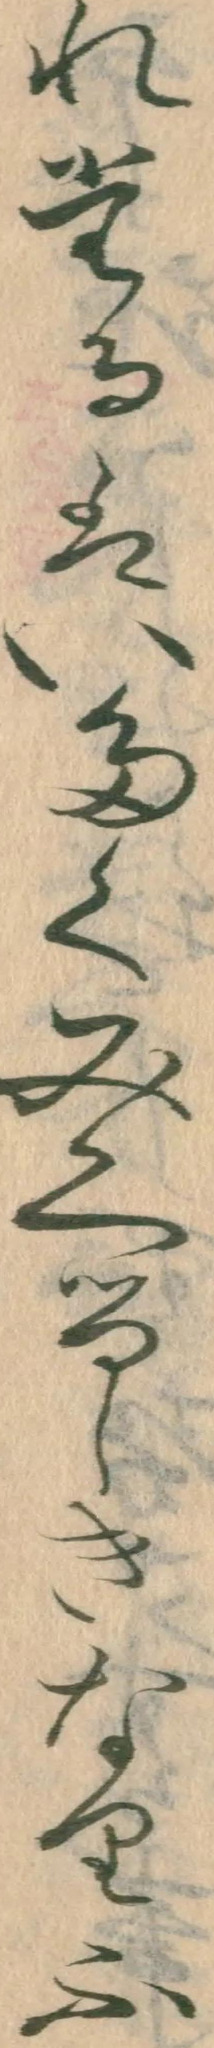れたるはいたくみくるしきなりふ
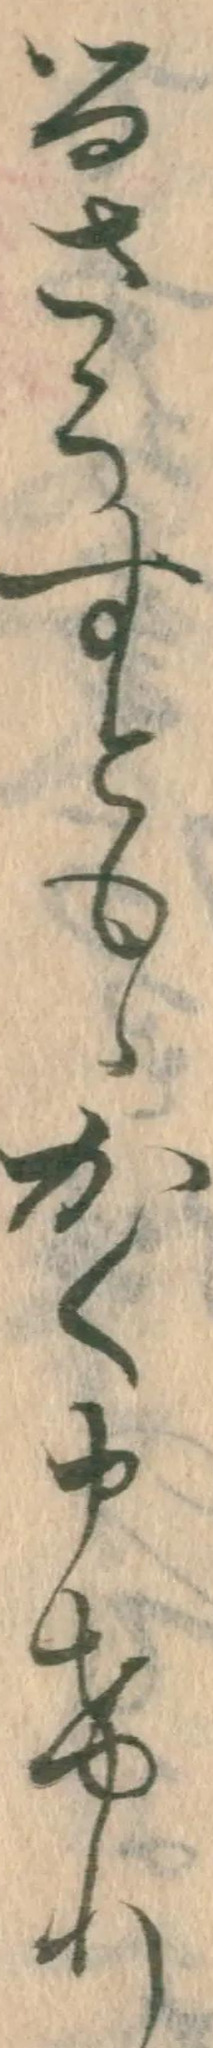るさうすともゝかく申けれ
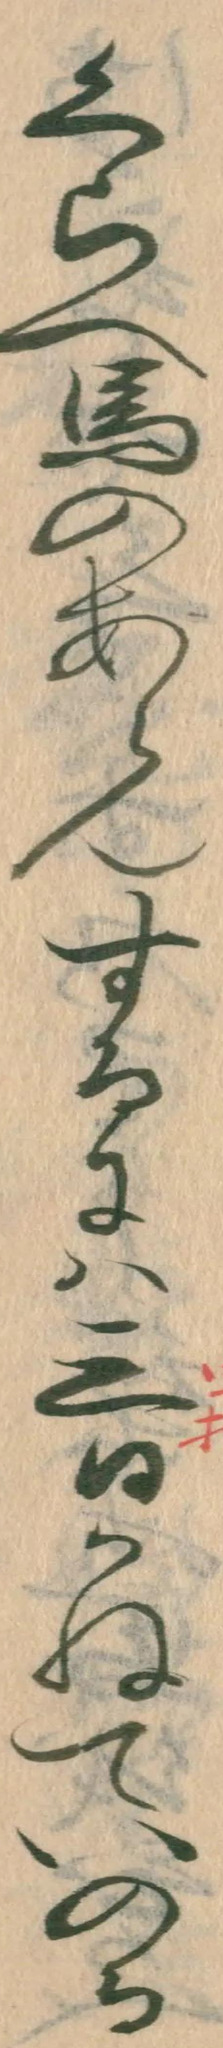一くらへ馬のあらんするには三日かねていのる
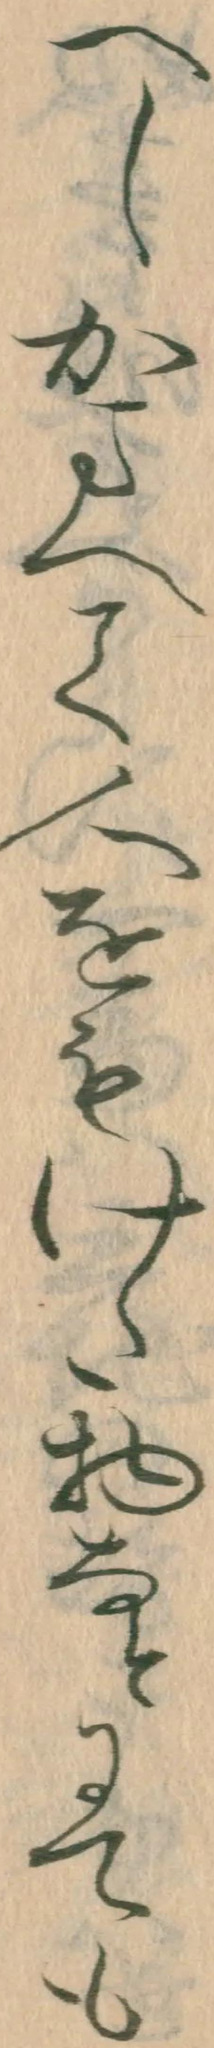へしかまへて人をもけた物なとにても
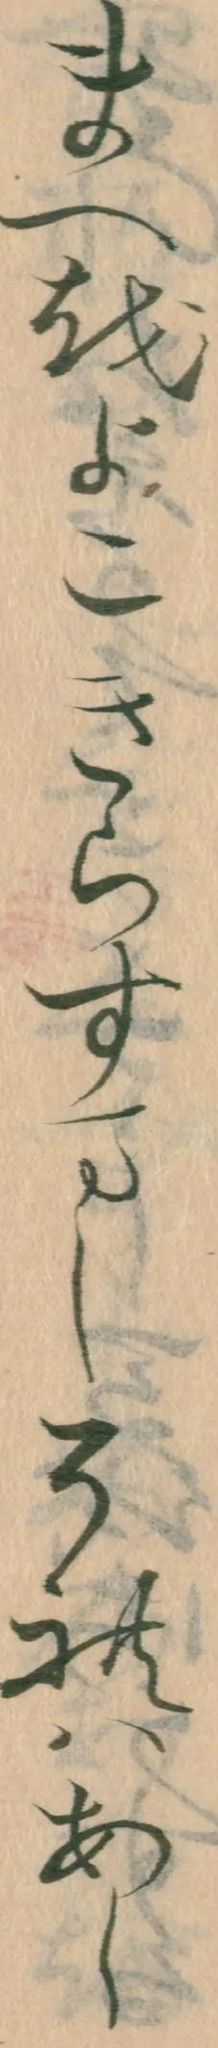まへをよこきらすましそれはあし
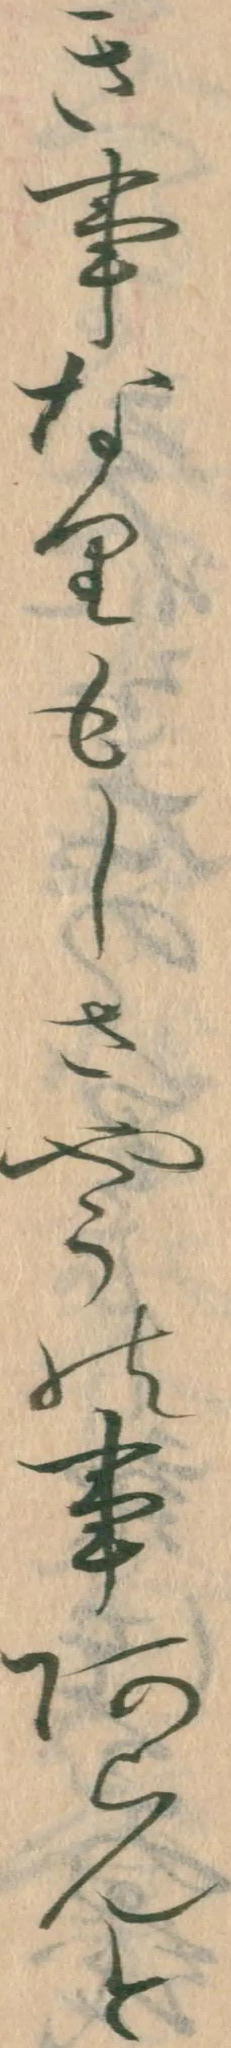き事なりもしさやうの事あらんと
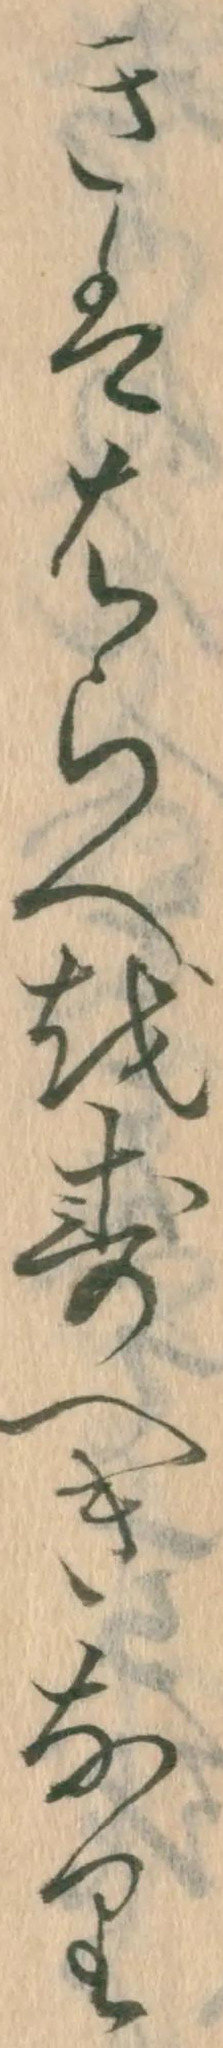きははらへをすへきなり
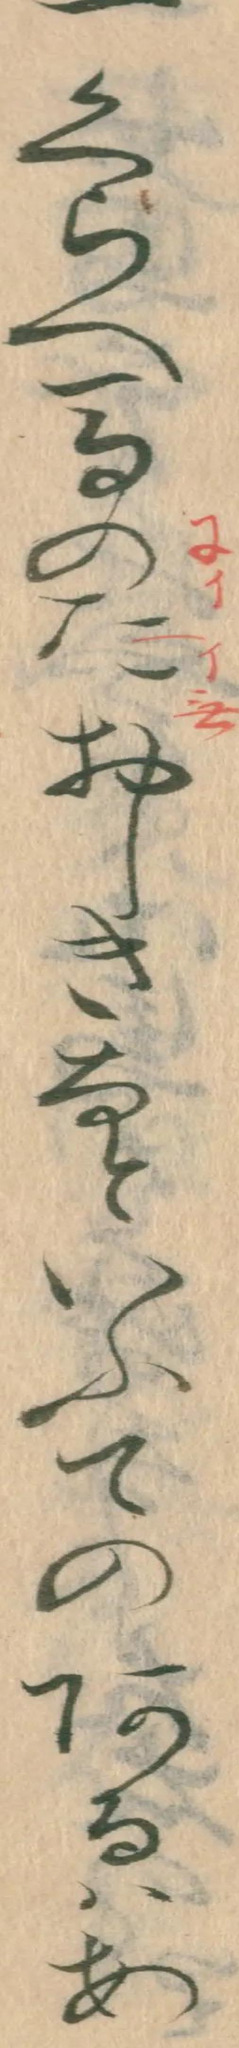一くらへ馬のたおしきなといふてのあるはあ
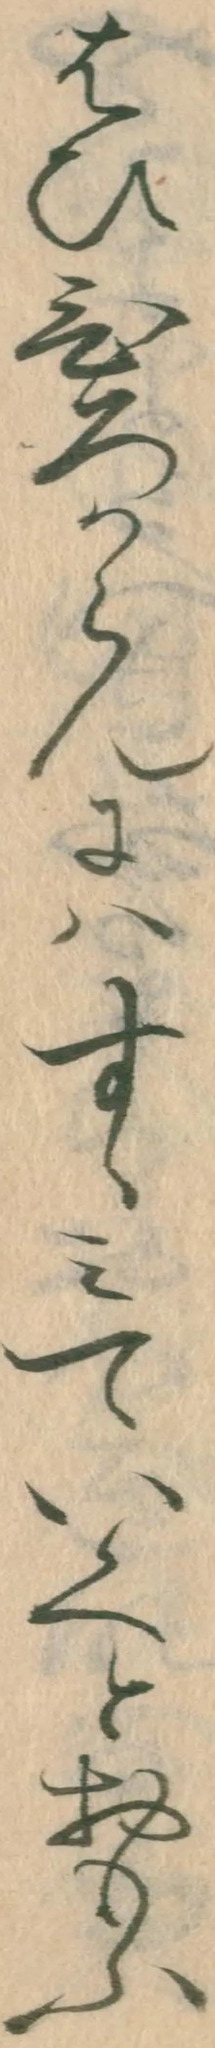はひひろからんにはすゝみていくとおもふ
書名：賀茂社記録. 第13冊
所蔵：国立国会図書館 National Diet Library, JAPAN
